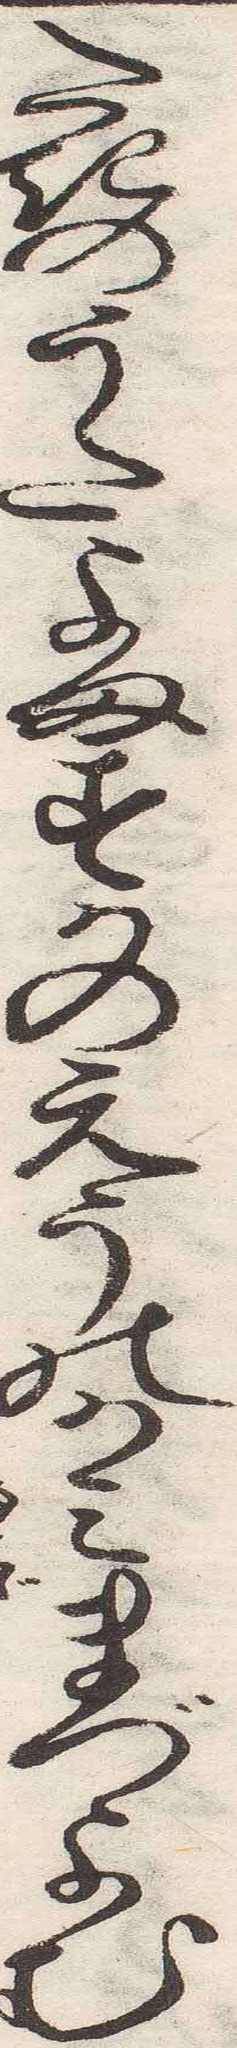たきのうたよますかのえうのかみまづよむ
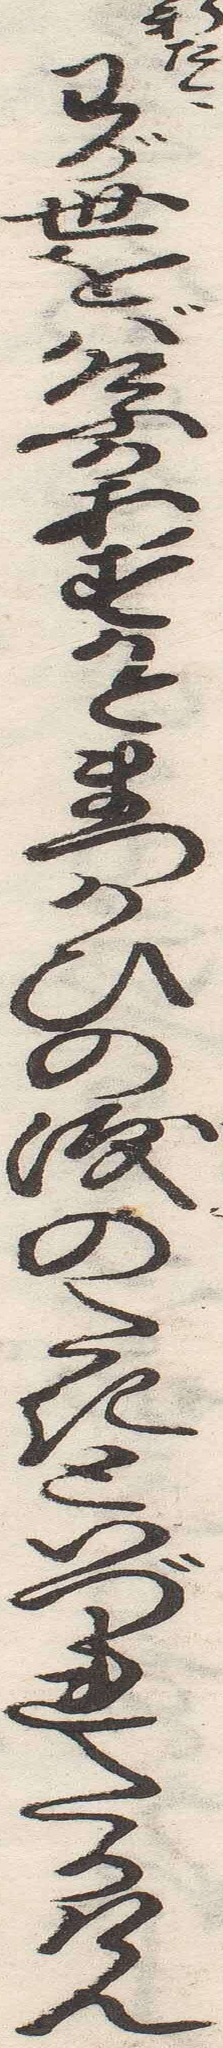新古今わが世をばけふかあすかとまつかひの涙のたきといづれたかけん
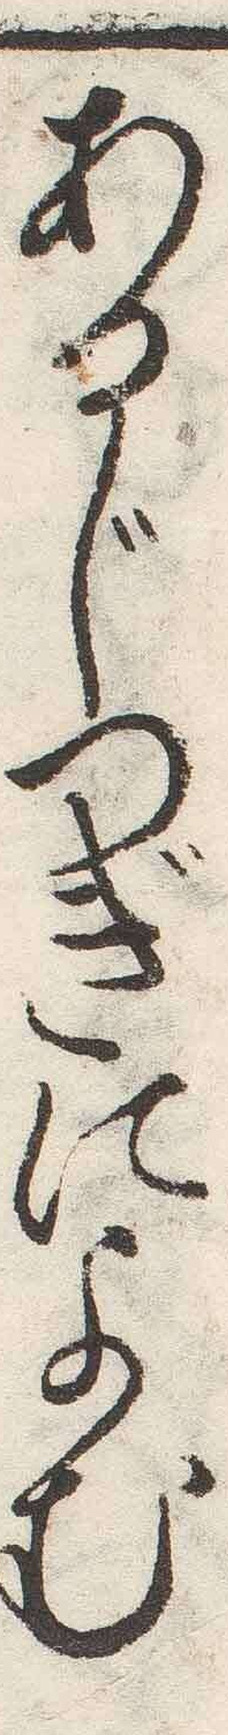あるじつぎによむ
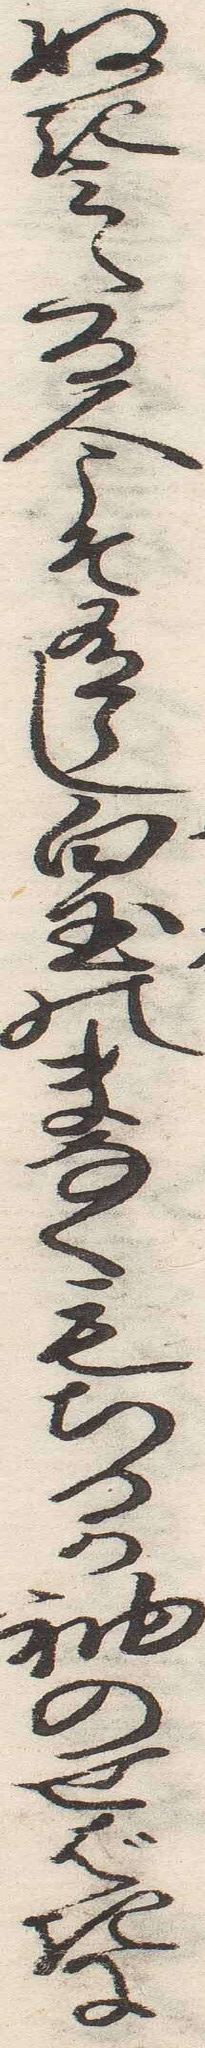ぬきみたる人こそ有らし白玉のまなくもちるか袖のせばきに
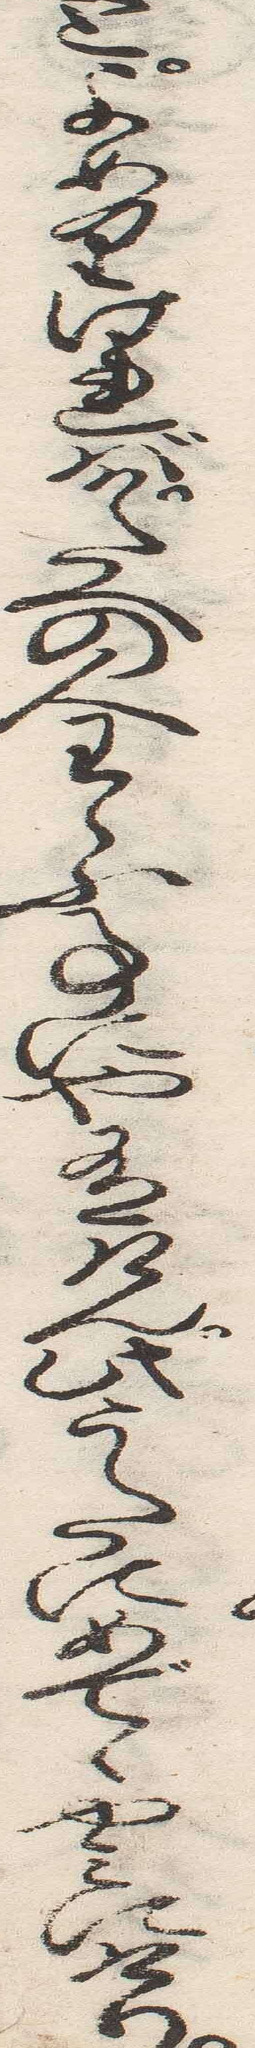と。よめりければ。かたへの人わらふ事にや有けん。此うたにめでゝやみにけり。
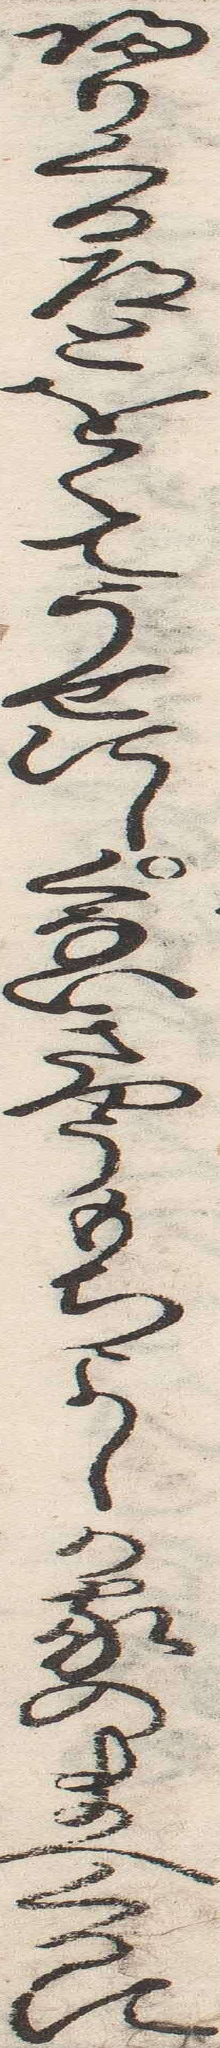帰りくる道とをくてうせにし。くないきやうもちよしか家のまへくるに
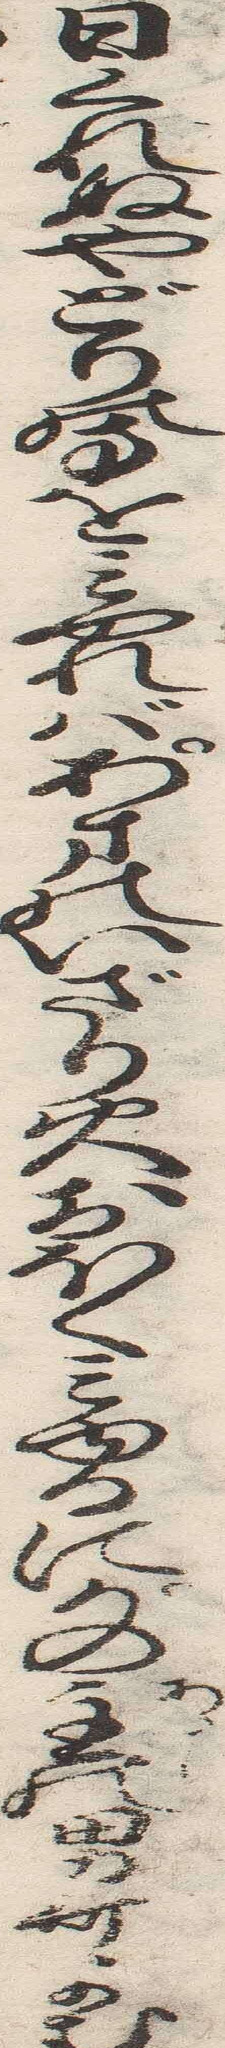日くれぬやどりの方をみやれば。あまのいざり火おほくみゆるに。かの主の男哥よむ
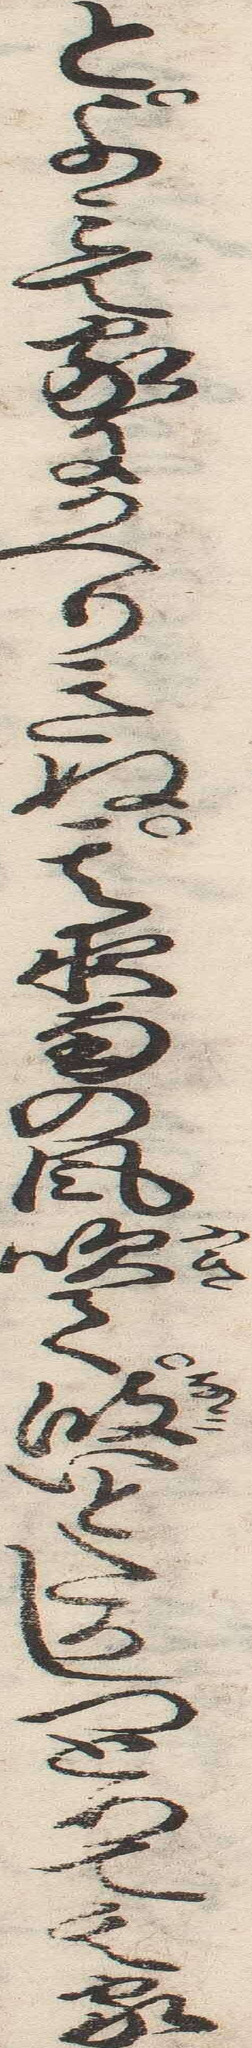と。よみて家にかへりきぬ其夜南の風吹て。波いとたかしつとめて其家
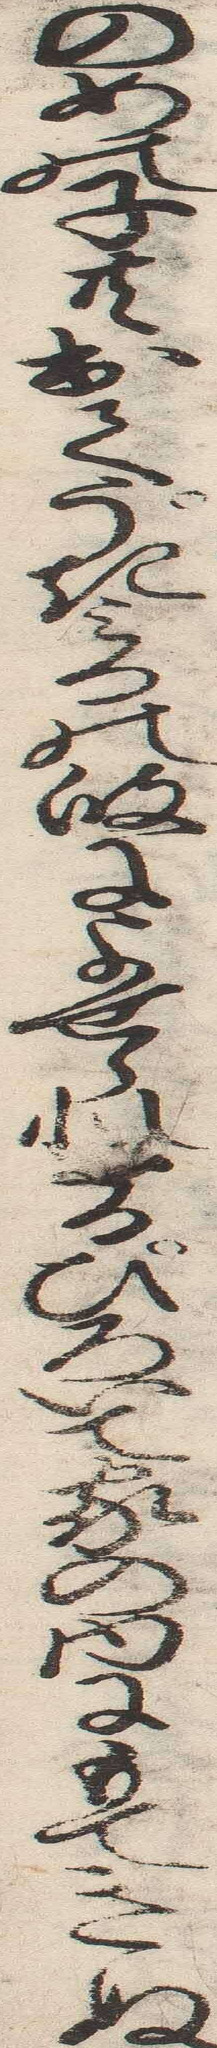のめの子共出て。うきみるの波によせられる。ひろいて家の内にもてきぬ

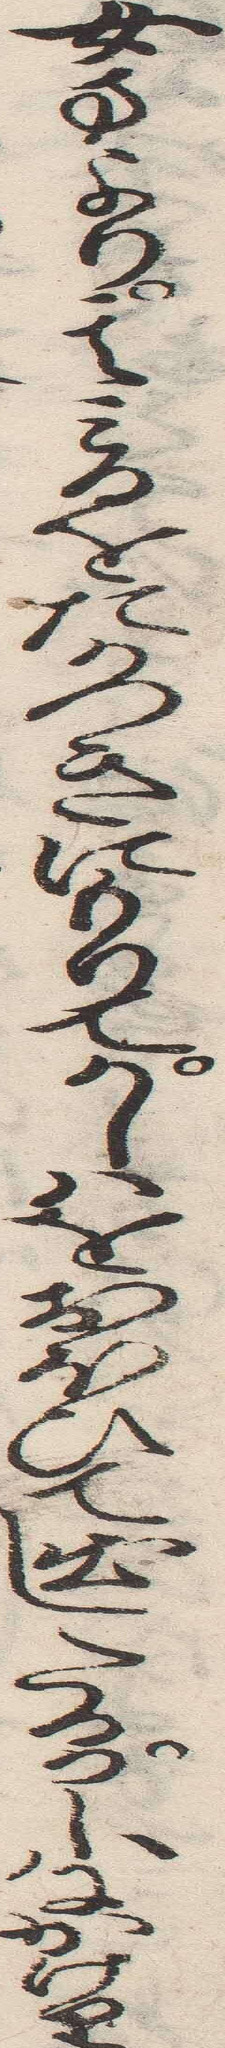女方より。其みるをたかつきにもりて。かしはをおほひて出したる。かしはにかけり
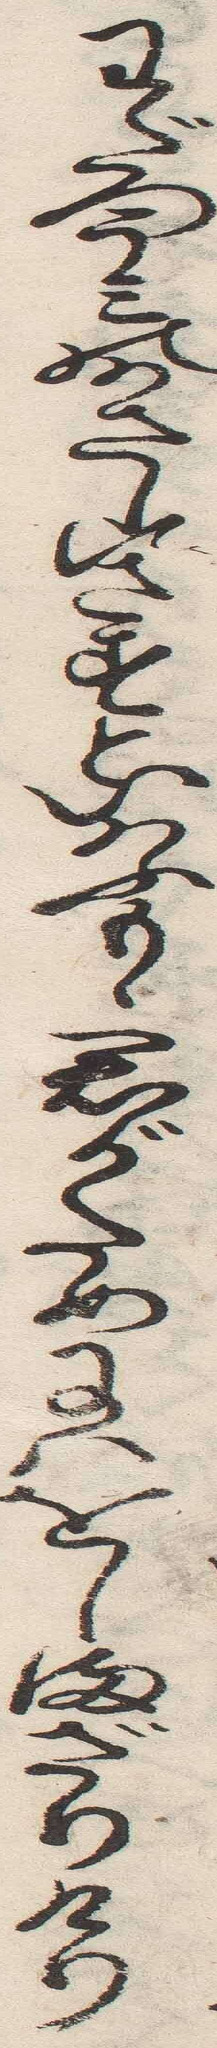わだつうみのかさしにさすといはふもゝ君がためにはをしまざりけり
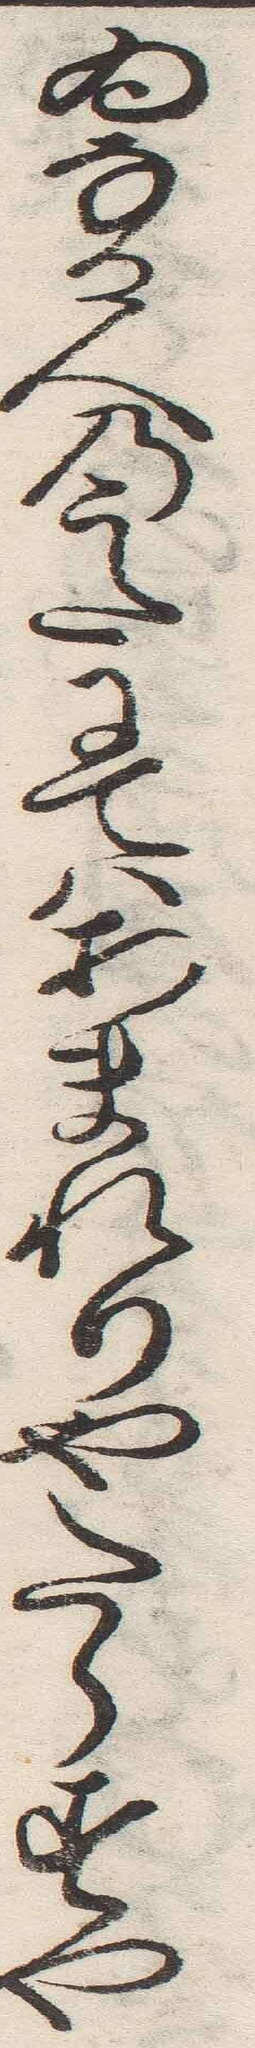ゐなか人の歌にてはあまれりやたらすや
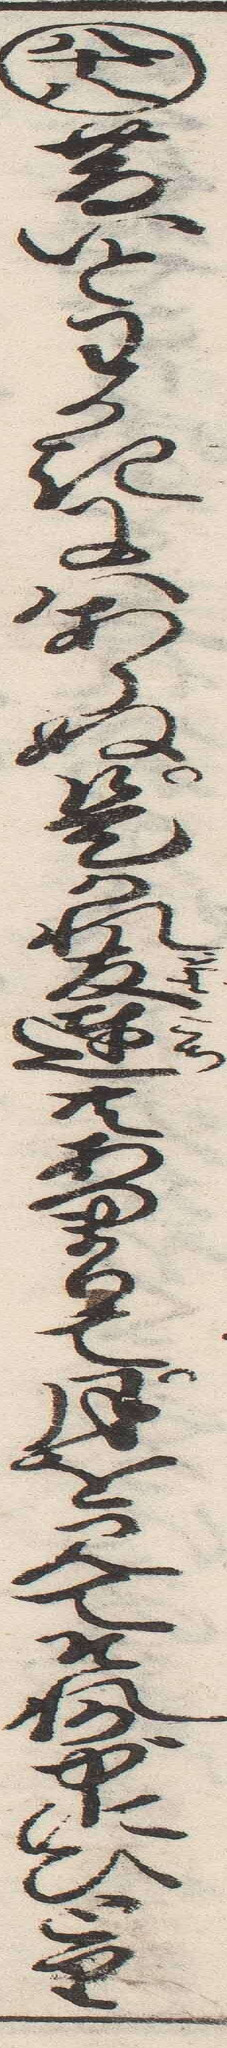八十八昔いとわかきにはあらぬ。是かれ友達共あつまりて。月を見てそれが中にひとり
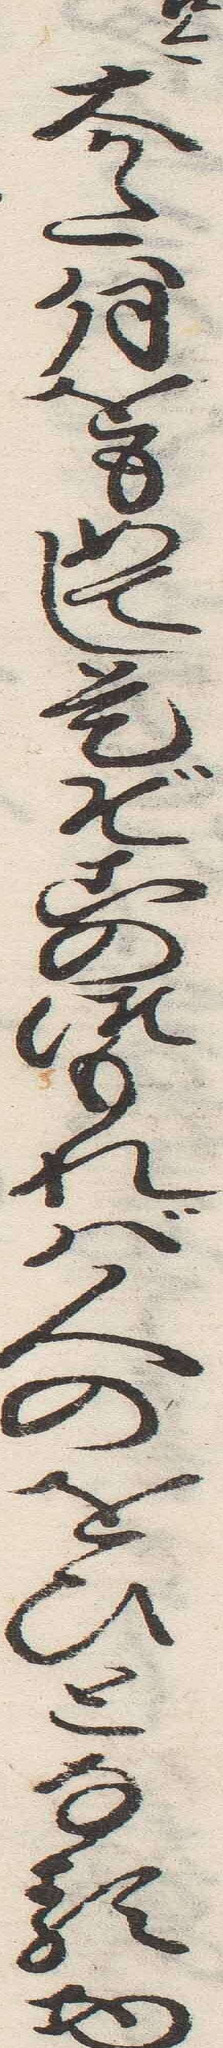古今大かたは月をもめてし是ぞこのつもれば人のをひとなる物
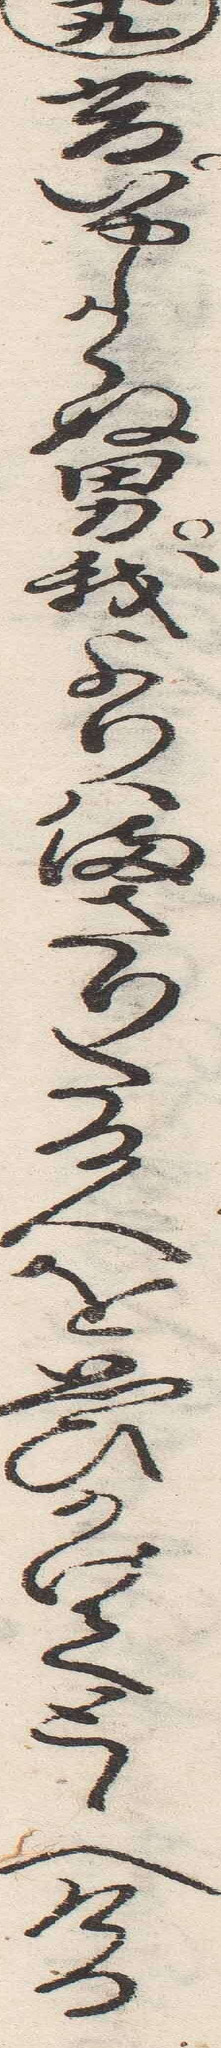八十九昔。いやしからぬ男。我よりはまさりたる人を思ひかけてとしへける
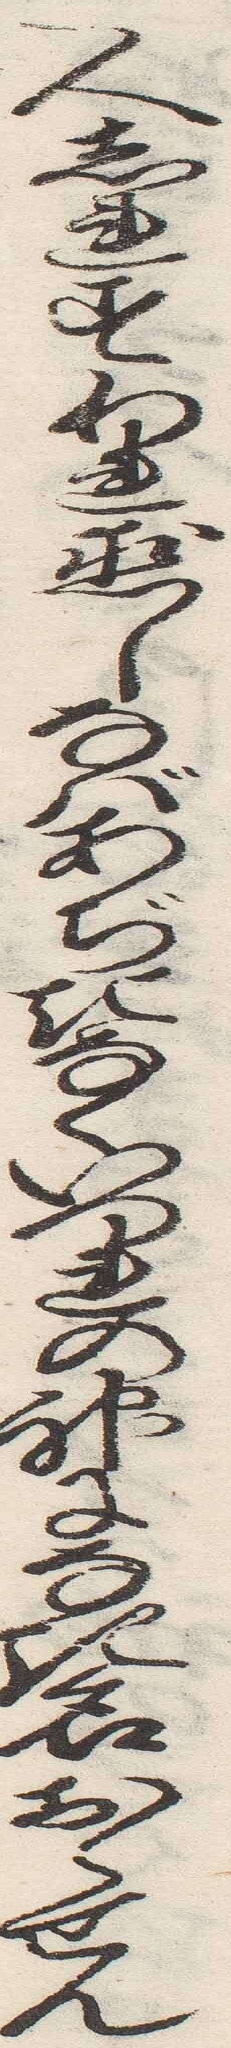人しれすわれ恋しなばあぢきなくいつれの神になき名おゝせん
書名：伊勢物語
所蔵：東京学芸大学附属図書館 国文学研究資料館
